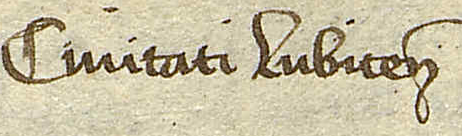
Ciuitati Lubicen*
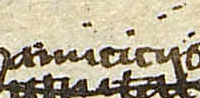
amiciciis
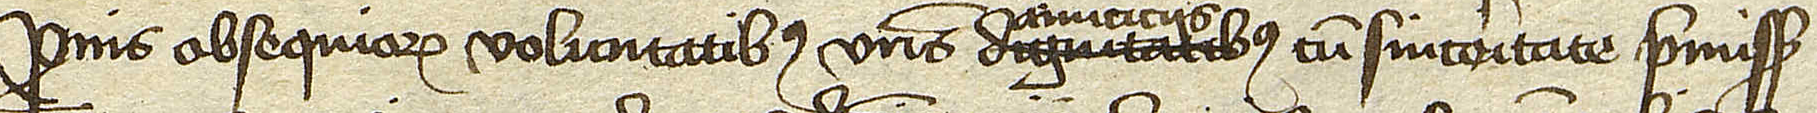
P*nis obſequio* voluntatib* v*ris dignitatib* cu* ſince*itate p*miſſ*
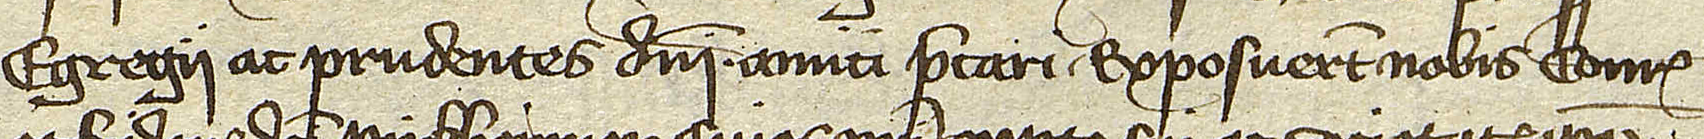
Egregii ac prudentes d*ni amici p*cari / Expoſuer*t nobis Conr*
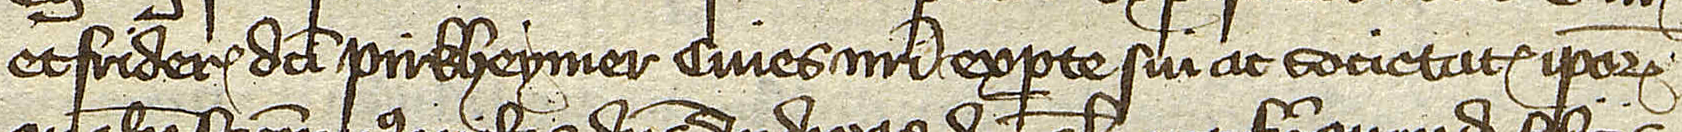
et Frider* d*ti Pirkheymer Ciues n*ri ex p*te ſui ac Societat* ip*
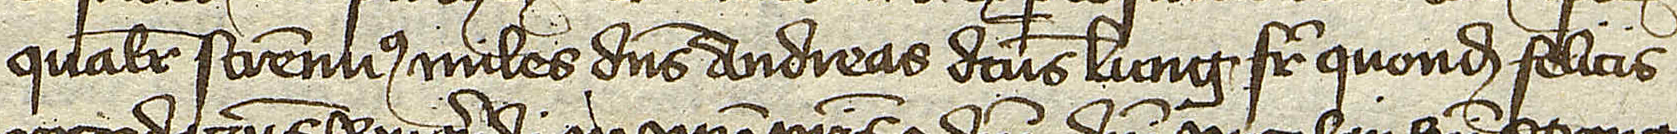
qual*r ſtrenu* miles d*n*s Andreas d*tus Lang fr* quond* felicis
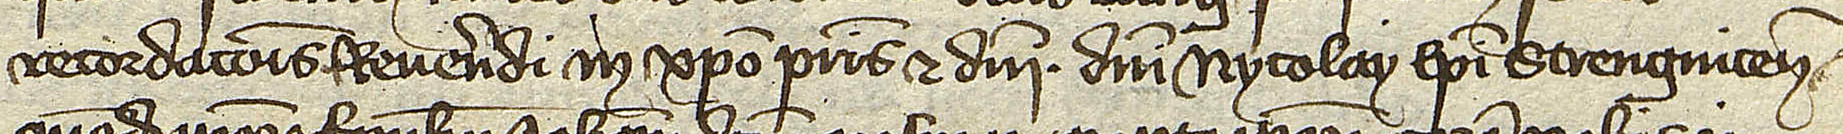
recordac*o*is Reue*ndi in xpo* pr*is @ d*ni . d*ni Nycolay Epi* Strengnicen*
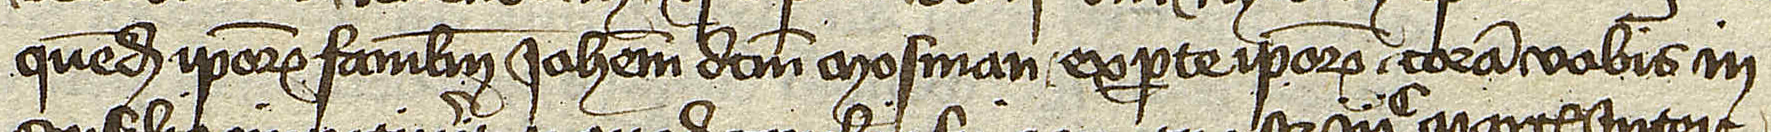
que*d* ip* fam*l*m Ioh*em d*c*m Moſman ex p*te ip* cora* vobis in
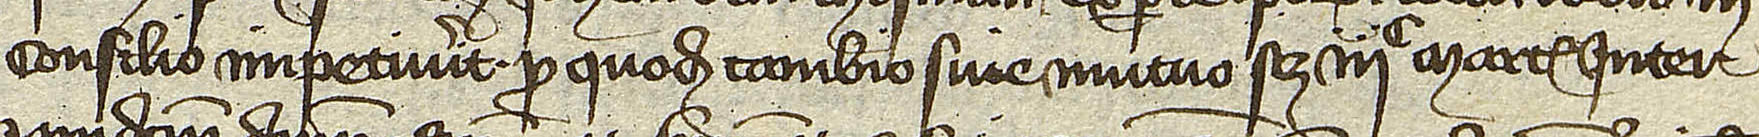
Conſilio impetiuit* . p* quod* cambio siue mutuo sc* iii* Marc* Inter
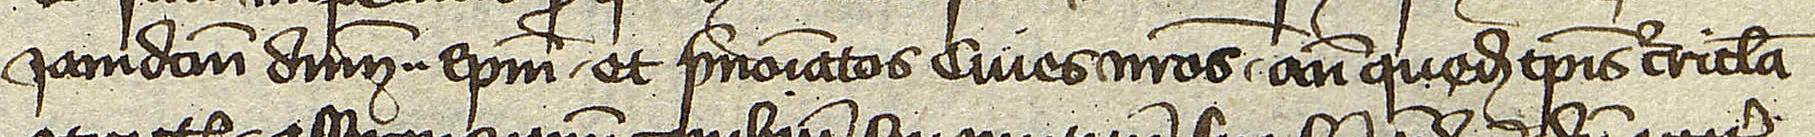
Iamd*c*m d*m*n* ~ Ep*m / et p*notatos Ciues n*ros / an* qued* t*p*is c*ric*la
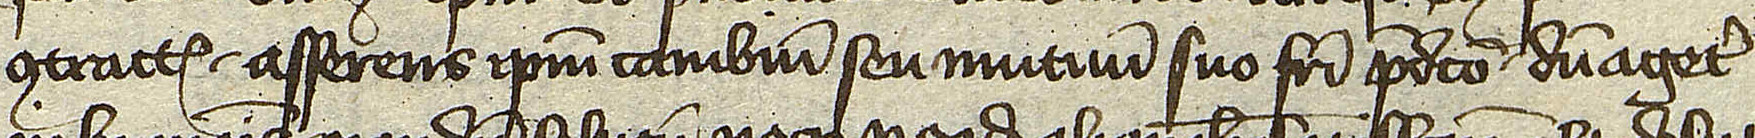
*tract* / afferens ip*m cambiu* ſeu mutuu* ſuo Fri* p*d*c*o / du* aget*
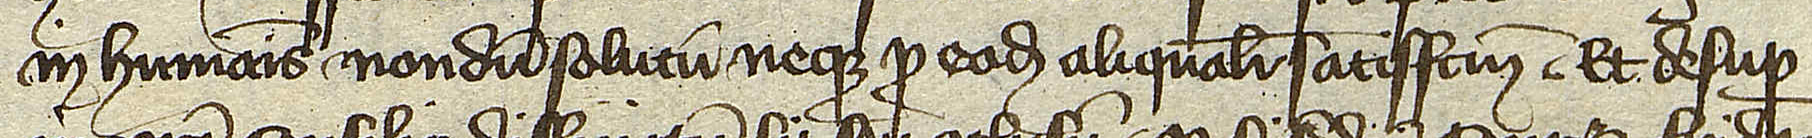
in huma*is / nondu* ſolitu* neq* p* ead* aliquali*r ſatisf*c*m / Et deſup*
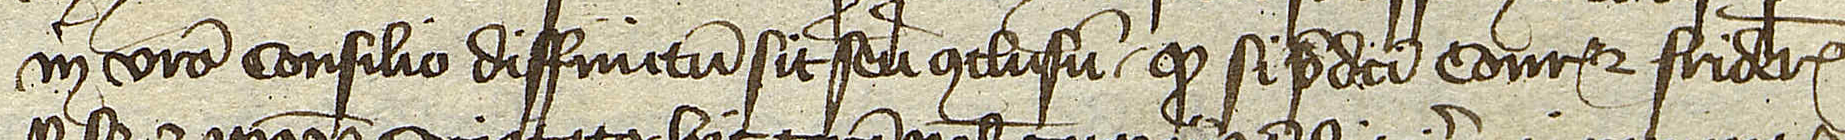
in v*ro Conſilio diffirmitu* ſit ſeu *cluſu* / q* ſi p*d*c*i Conr* @ Frider*
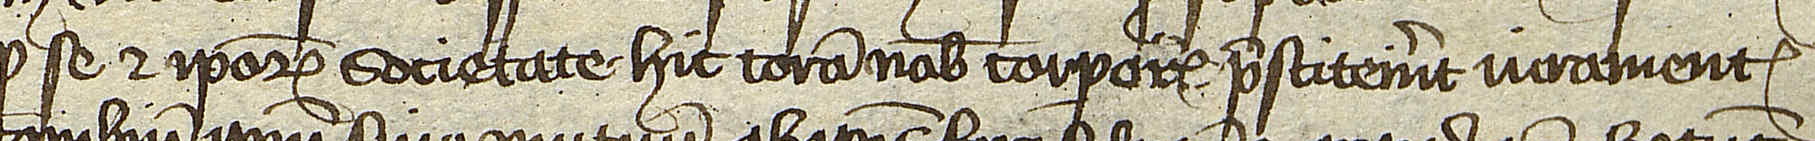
p* ſe @ ip*o* Societate hic cora* nob* corpor* p*ſtiteri*t iurament*
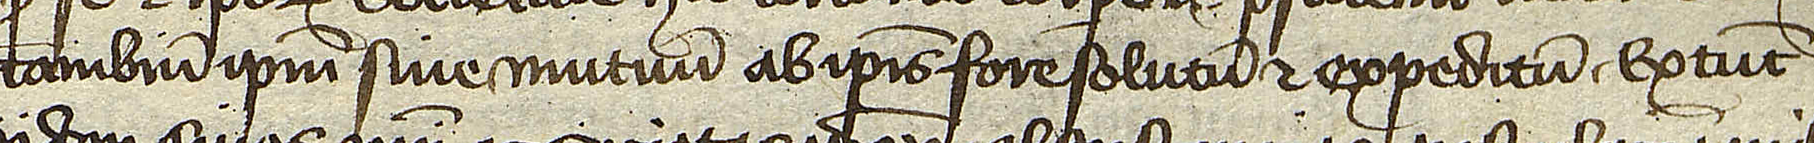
cambiu* ip*m ſiue mutuu* ab ip*is fore ſolutu* @ expeditu* / Ext*nt
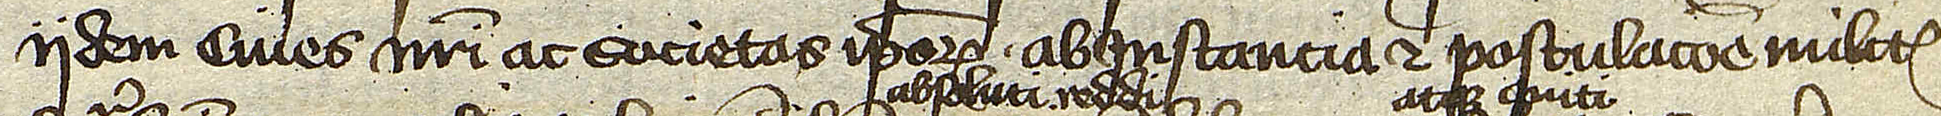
iidem Ciues n*ri ac Societas ip*or* / ab Inſtantia @ poſtulac*o*e milit*
